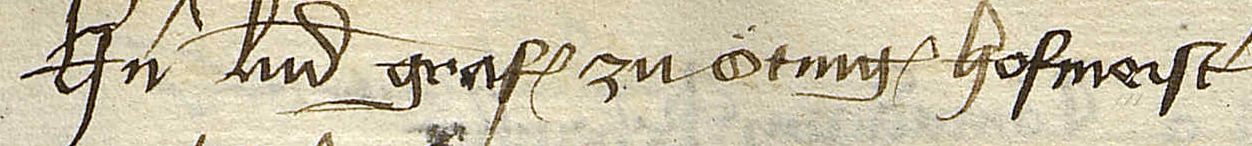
Hn* Lud* graf* ʒu Öting* hofmeiſt*
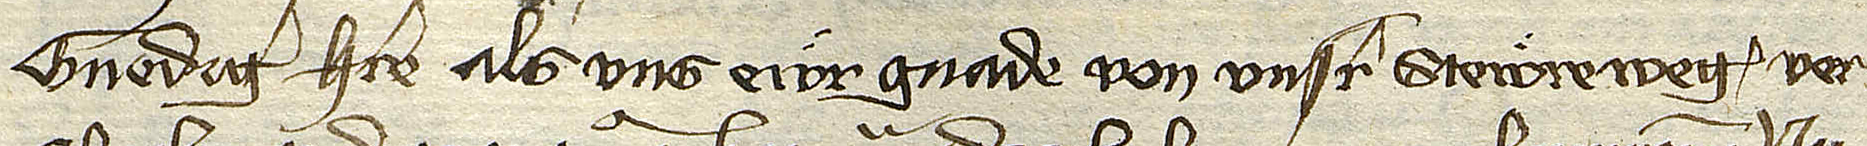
Gnedig* hre* als vns ewr gnade von vnſr* Stewre weg* ver =
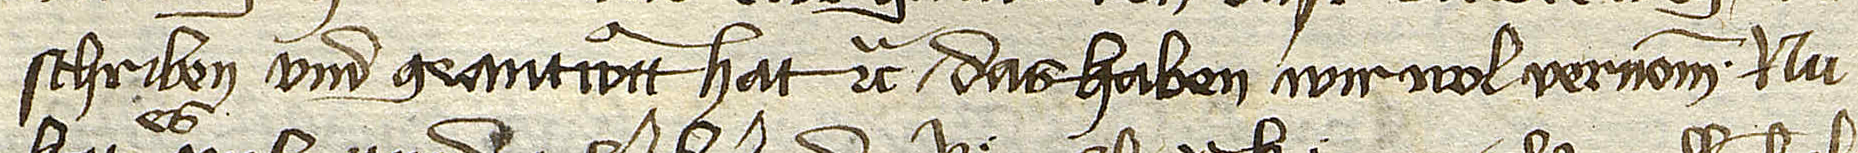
ſchriben vnd geantwrt* hat ec* / das haben wir wol vernom* . Nu
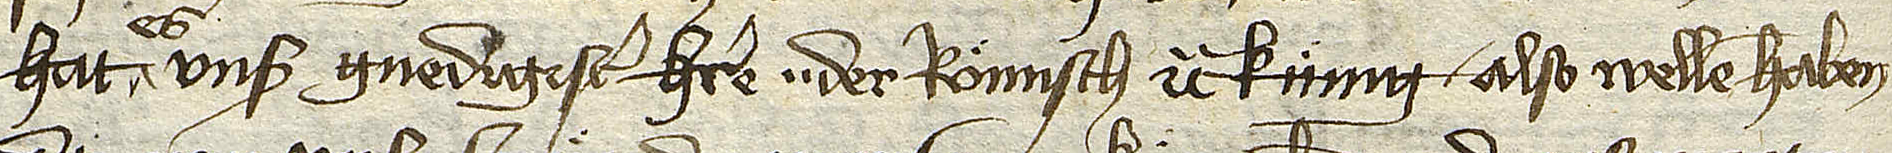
hat vnſ* gnedigiſt hre* ~ der Römiſch ec* Künig / alſo welle* haben
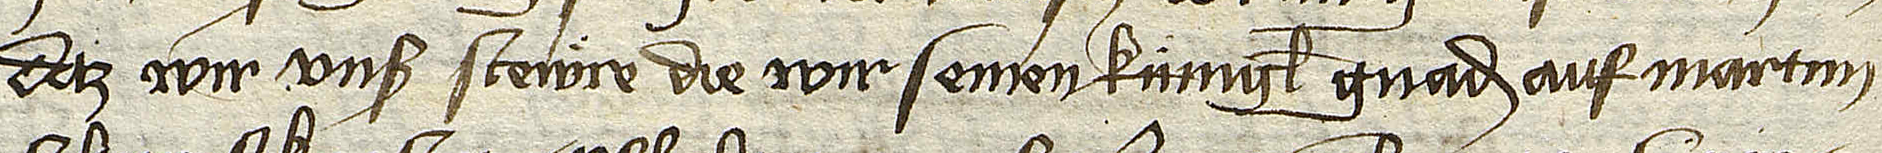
daʒ wir vnſ* ſtewre die wir ſeinen künigl* gnad* auf martini
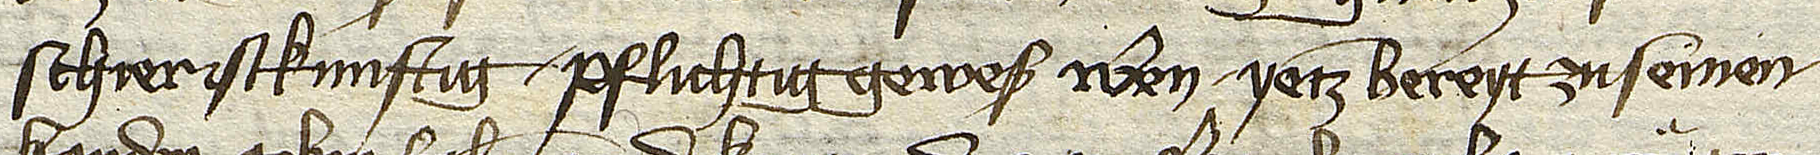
ſchieriſtkunftig / pflichtig* geweſ* w*en / yecʒ* bereyt ʒu ſeinen
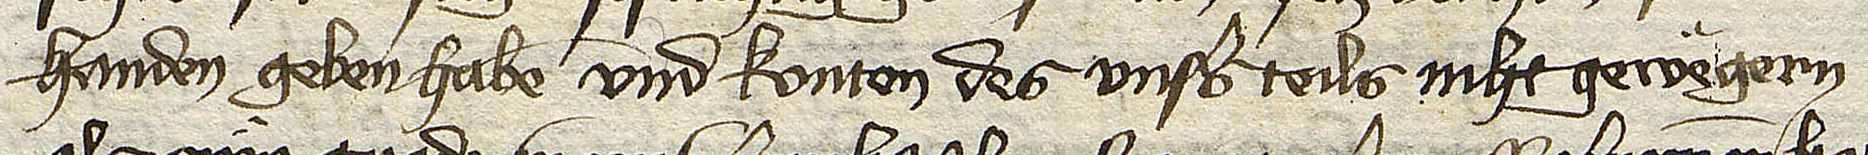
handen geben habe* vnd konten des vnſs* teils niht gewëgern
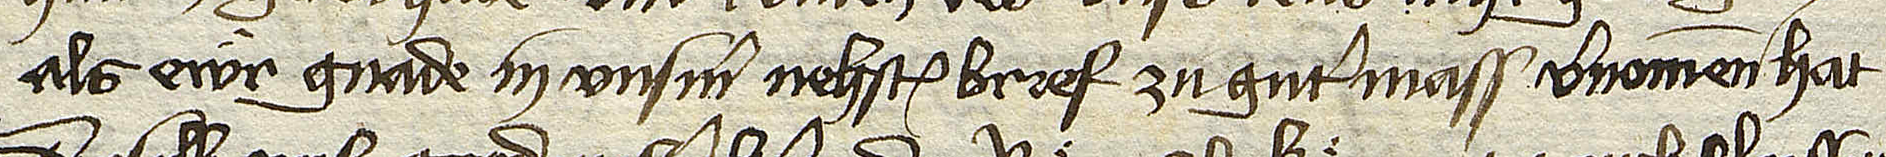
als ewr gnade in vnſm* nehſt* brief ʒu gut* maſſ v*nomen* hat
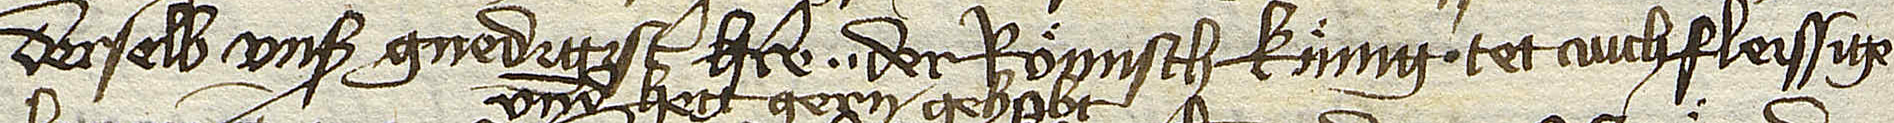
Derſelb vnſ*gnedigiſt* hre* ~ der Römiſch Künig . tet auch fleiſſige
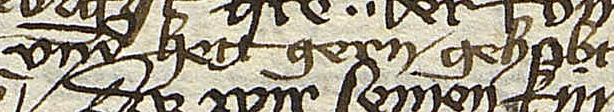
vnd hett gern gehabt
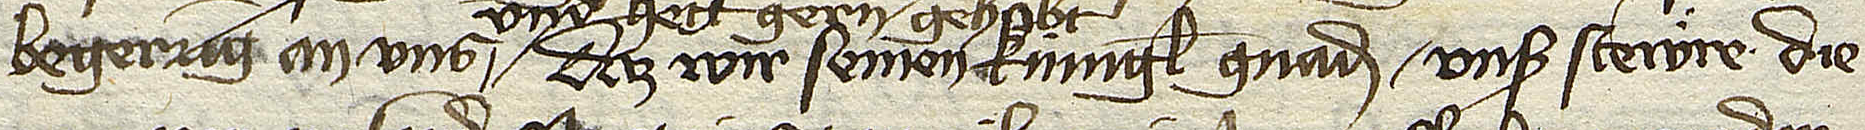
begerug* an vns / Daʒ wir ſeinen künigl* gnad* / vnſ* stewre . die
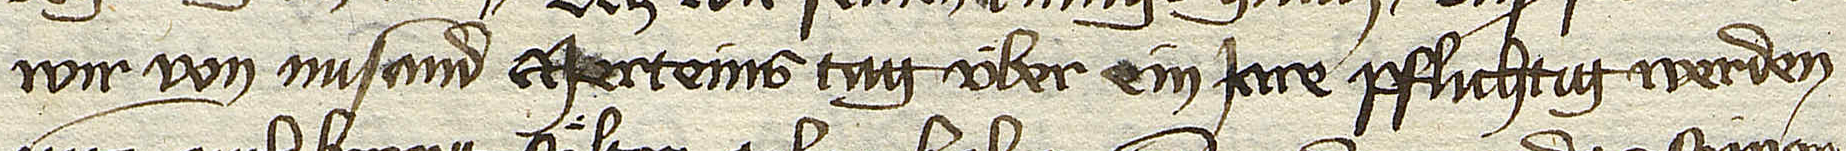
wir von nu ſand Merteins tag v̈ber ein Iare pflichtig werden
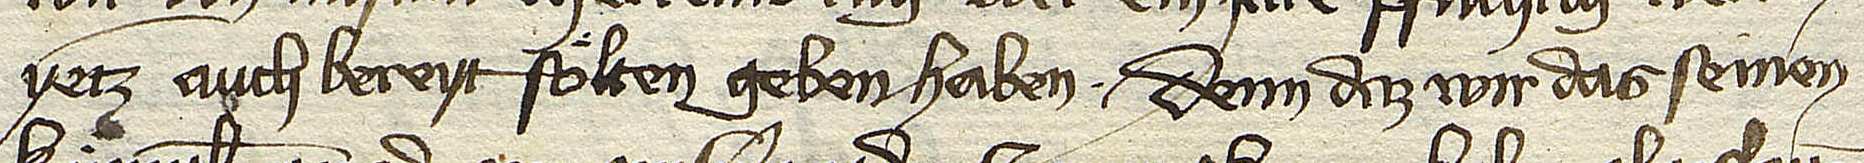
yecʒ* auch bereyt ſölten geben haben . / Denn daʒ wir das ſeinen
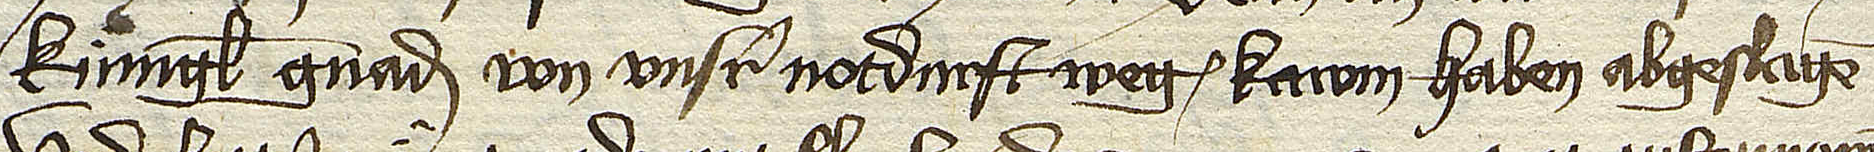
künigl* gnad* von vnſr* notdurft weg* kawm haben abgeſlage*
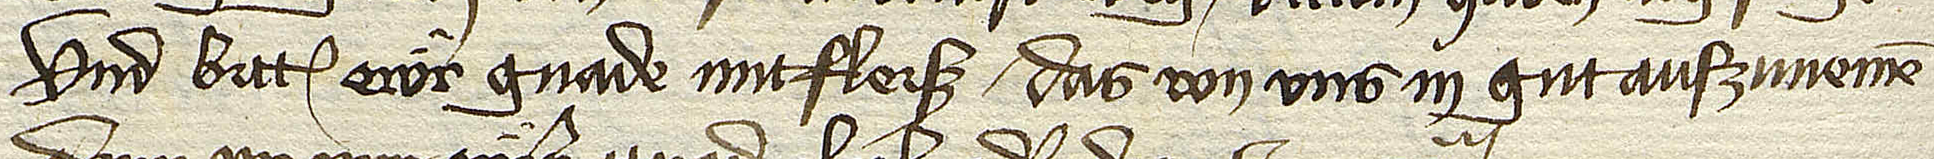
Vnd bitt* ewr gnade mit fleiſʒ / das von vns in gut aufʒuneme*
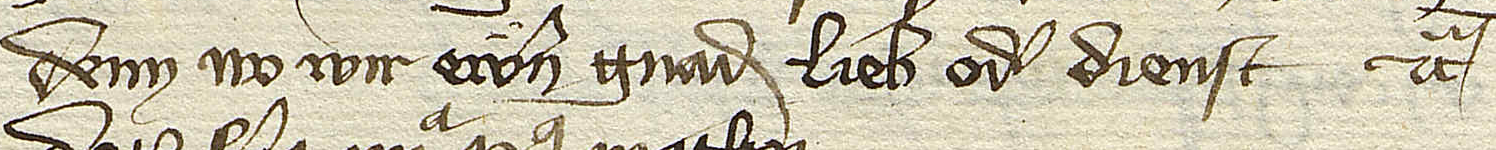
Denn wo wir ewn* gnad* lieb od* dienſt ec*
